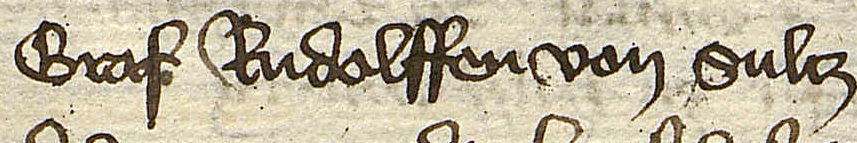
Graf Rudolffen von Sulcʒ
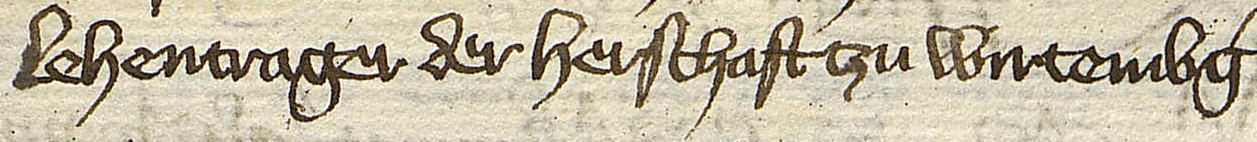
lehentrager der herſchaft cʒu wirtemb*g
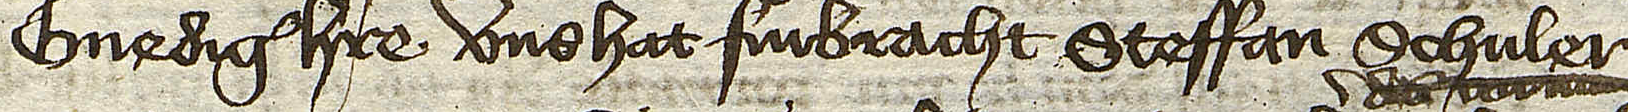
Gnedig* h*re . Vns hat fürbracht Steffan Schuler
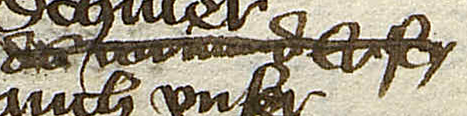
des vormund Er ſey
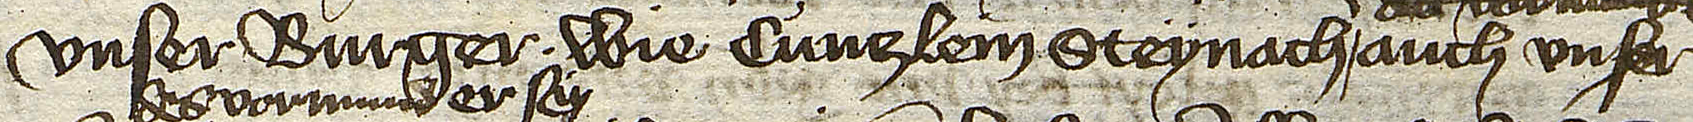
vnſer Burger . wie Cüncʒlein Steynach auch vnſer
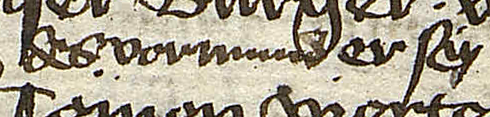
des vormund er ſey
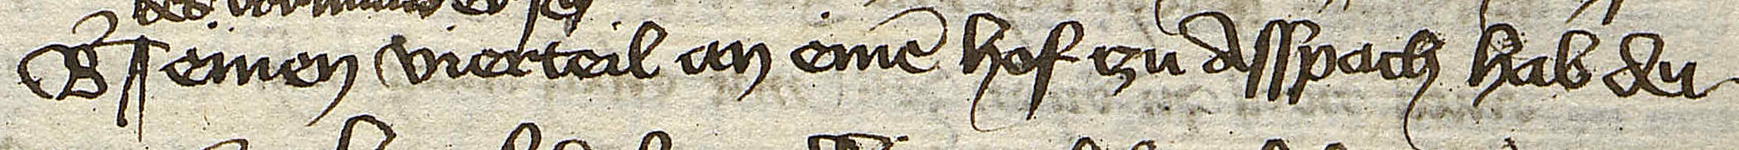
B* einen vierteil an eine* hof cʒu Aſſpach hab der
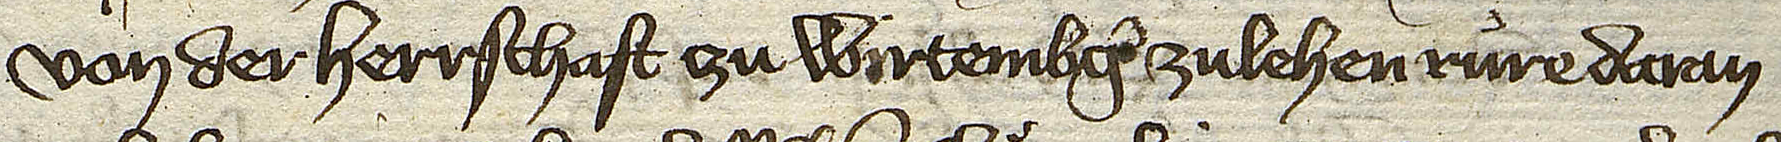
von der herrſchaft cʒu wirtemb*g cʒulehen rüre daran
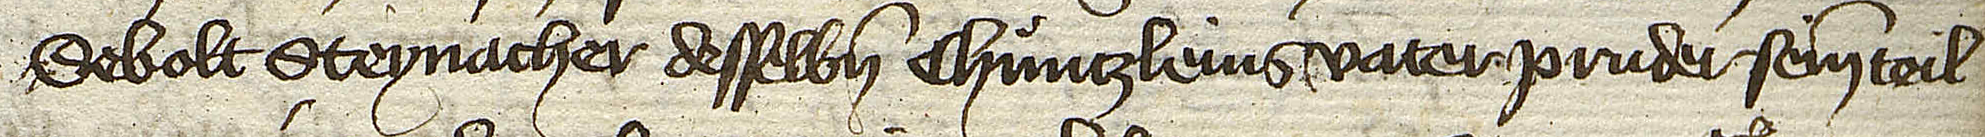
Sebolt Steynacher deſſelbn* Chüncʒleins vater pruder ſein* teil
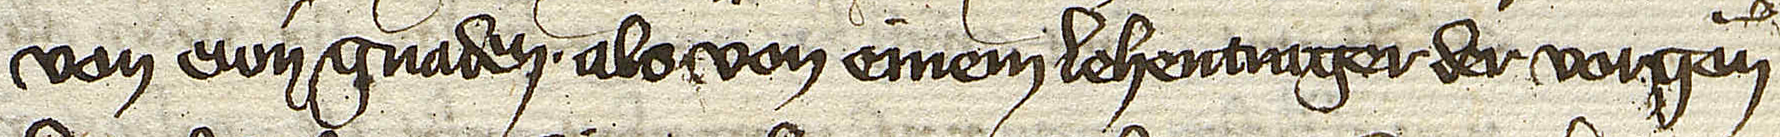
von ewn* gnaden . als von einem lehentrager der vorgen*
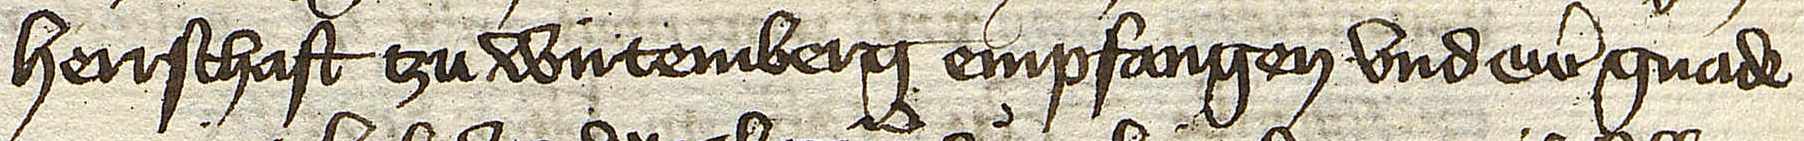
herrſchaft cʒu wirtemberg empfangen vnd ew* gnade
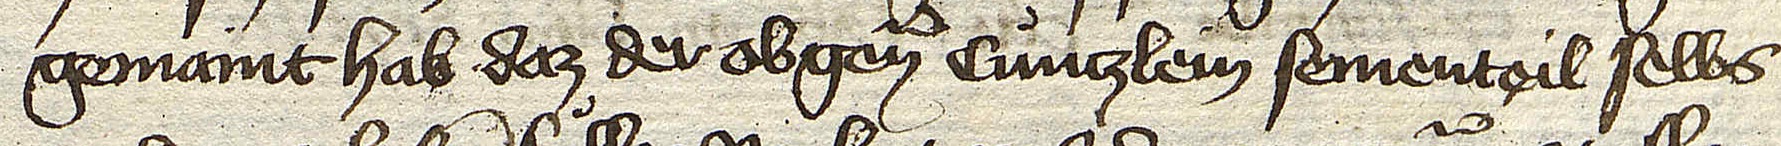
gemaint hab / daʒ der obgen* Cüncʒlein ſeinenteil ſelbs
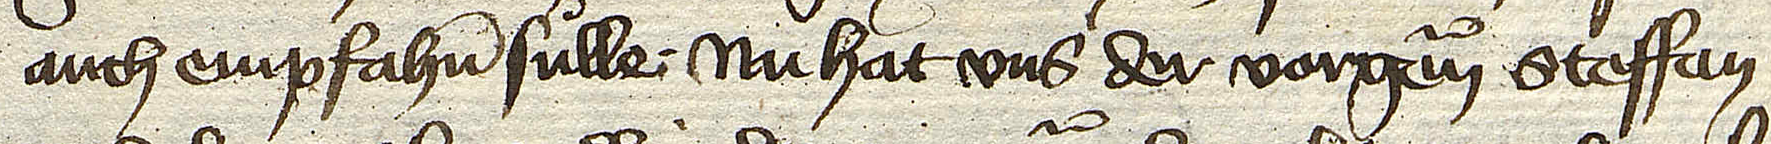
auch empfahn* ſülle . Nu hat vns der vorgen* Steffan
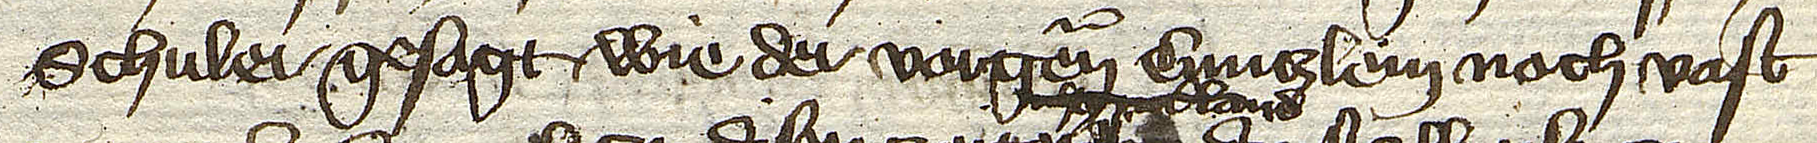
Schuler geſagt / wie der vorgen* Cuncʒlein noch vaſt
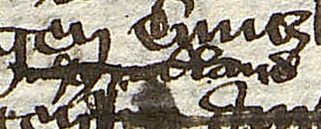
%%%% %%% land
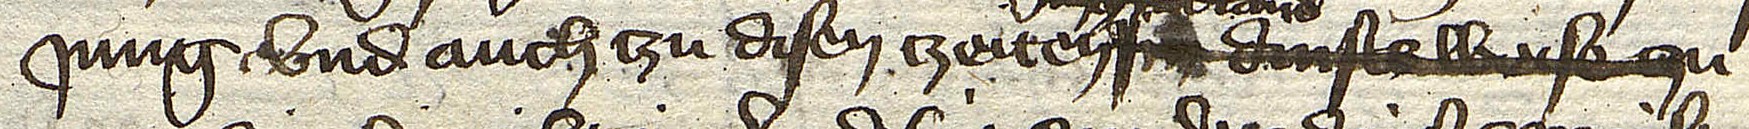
Iung vnd auch cʒu diſen cʒeiten Im dinſte weiſe cʒu
